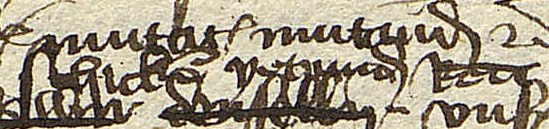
ſchicke* yecʒund Rete
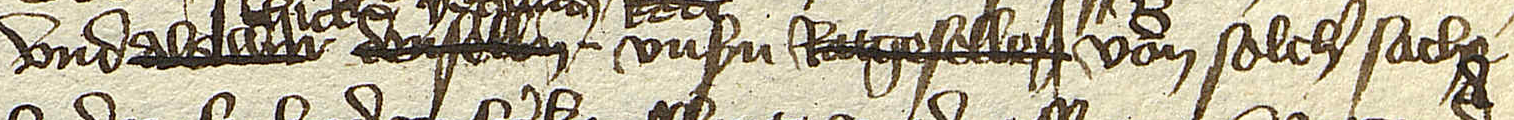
vnd als wir denſelbn* ~ vnſ*n Ratgeſellen von ſolch* ſache
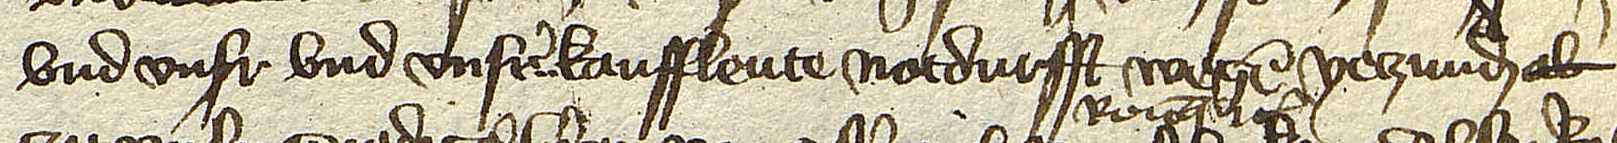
vnd vnſ*r vnd vnſr* ~ kauffleute notdurfft wege* yecʒund* ab*
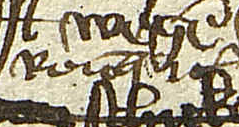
Reichh*
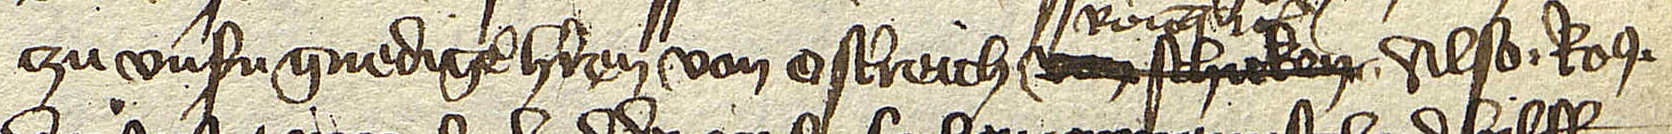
cʒu vnſ*n gnedige* h*ren von Oſt*reich von ſchicken / . Alſo . Ro* .
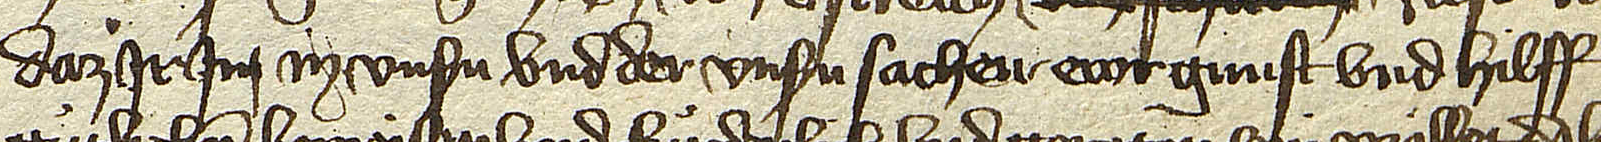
daʒ Ir Im in vnſ*n vnd der vnſ*n ſachen ewr gunſt vnd hilff
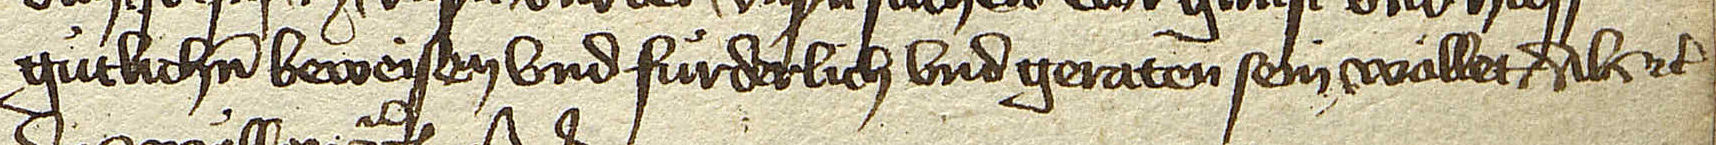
gütlichn* beweiſen vnd fürderlich vnd geraten ſein wöllet / Als ec*
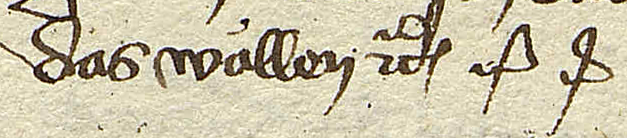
das wöllen ec* § §
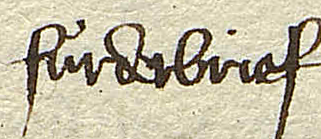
fürderbrief
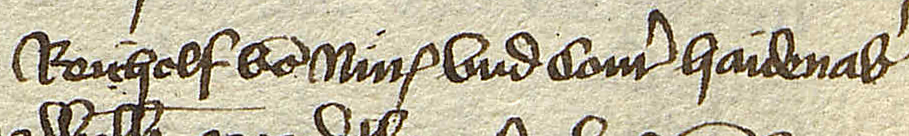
Reicholf vo* Nür* vnd Conr* haidenab*
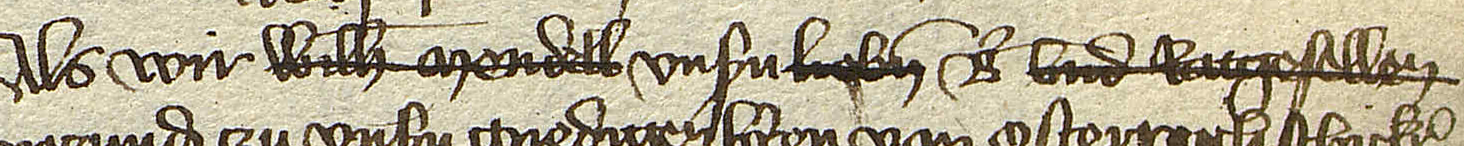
Als wir Wilh* Mendell vnſ*n liebn* B* vnd Ratgeſellen
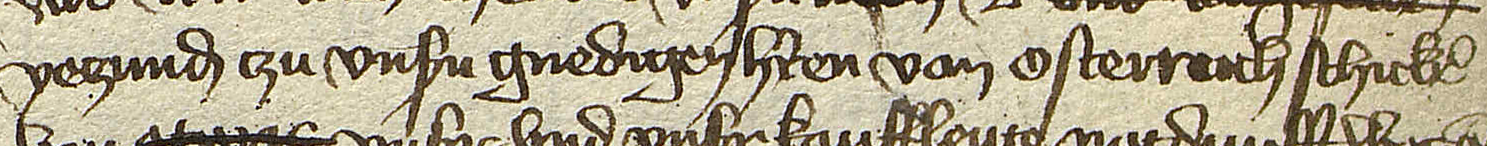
yecʒund* cʒu vnſ*n gnedigen h*ren von Oſterreich ſchicke*
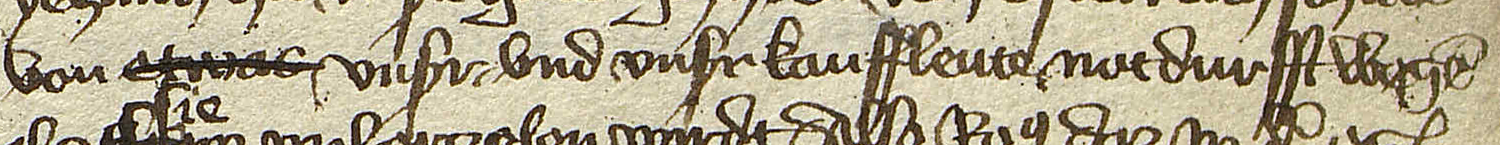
von etwas vnſ*r / vnd vnſ*r kauffleute notdurfft wege*
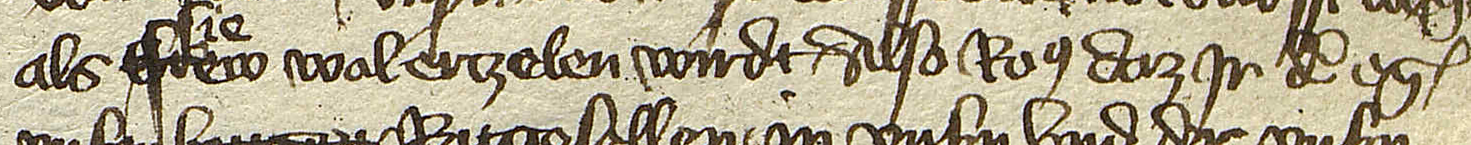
als %%%ew wol ercʒelen wirdt / Alſo / Ro* daʒ Ir d* eg*
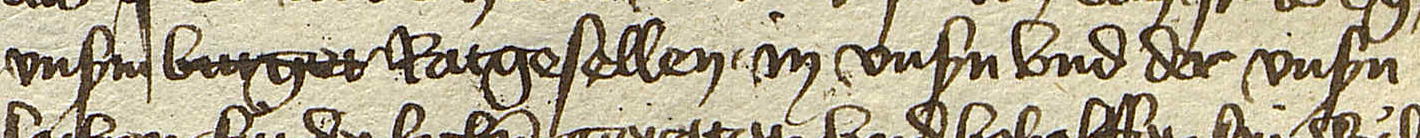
vnſ*m burger Ratgeſellen in vnſ*n vnd der vnſ*n
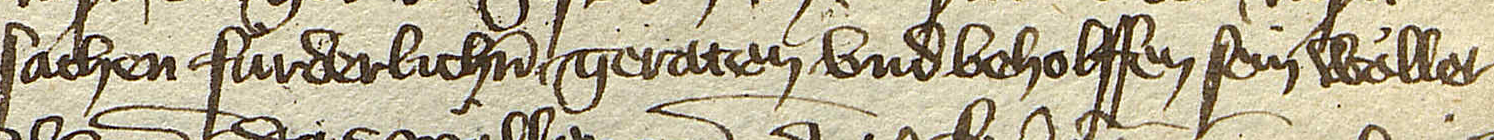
ſachen fürderlichn* geraten / vnd beholffen ſein wöllet
